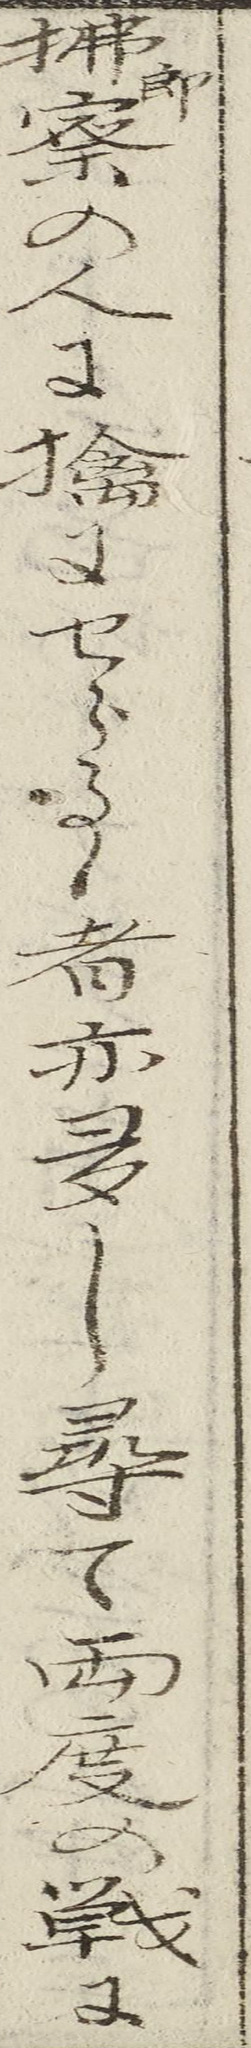拂郎察の人に擒にせらるし者亦多し尋て両度の戦に
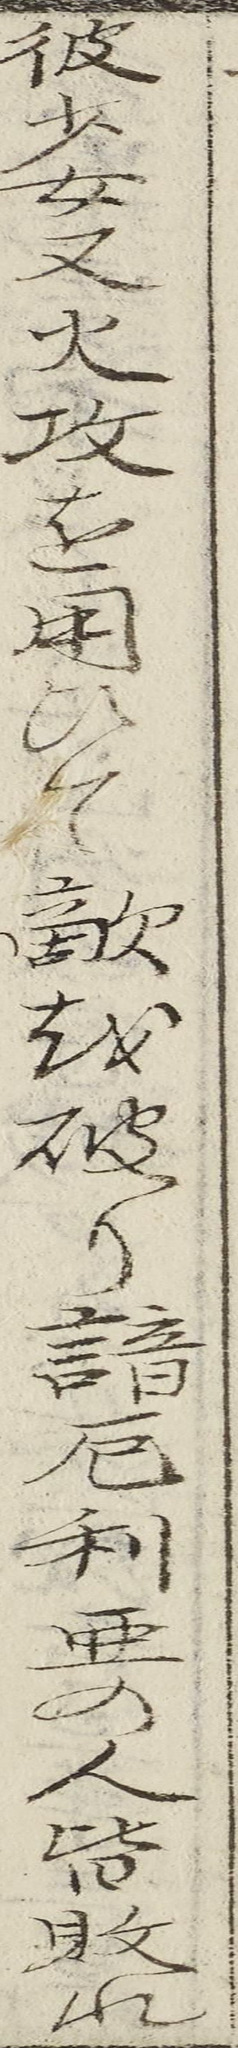彼少女又火攻を用ひて敵を破り諳厄利亜の人皆敗れ
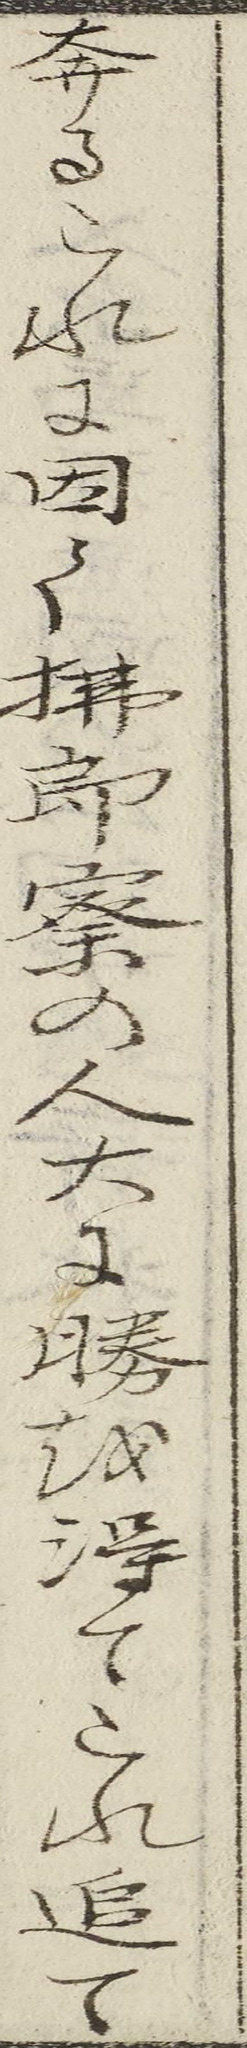奔るこれに因て拂郎察の人大に勝を得てこれ追て
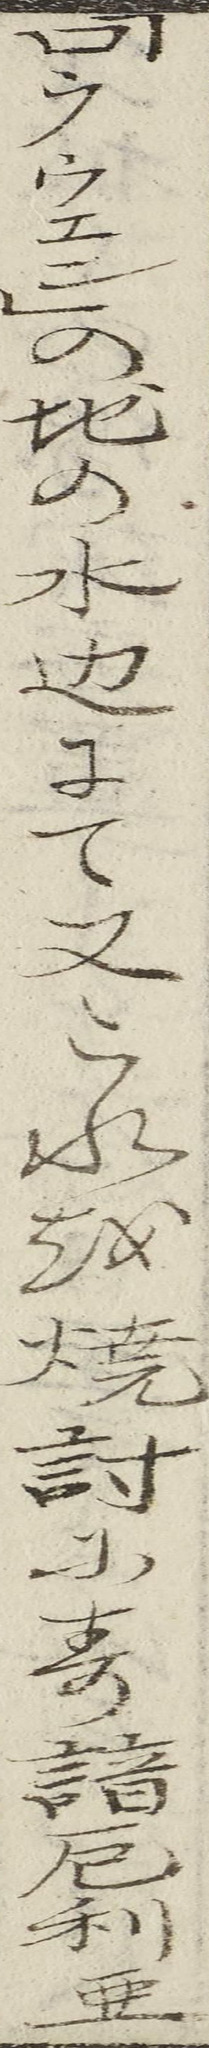「ロウウエン」の地の水辺にて又これを焼討にす諳厄利亜
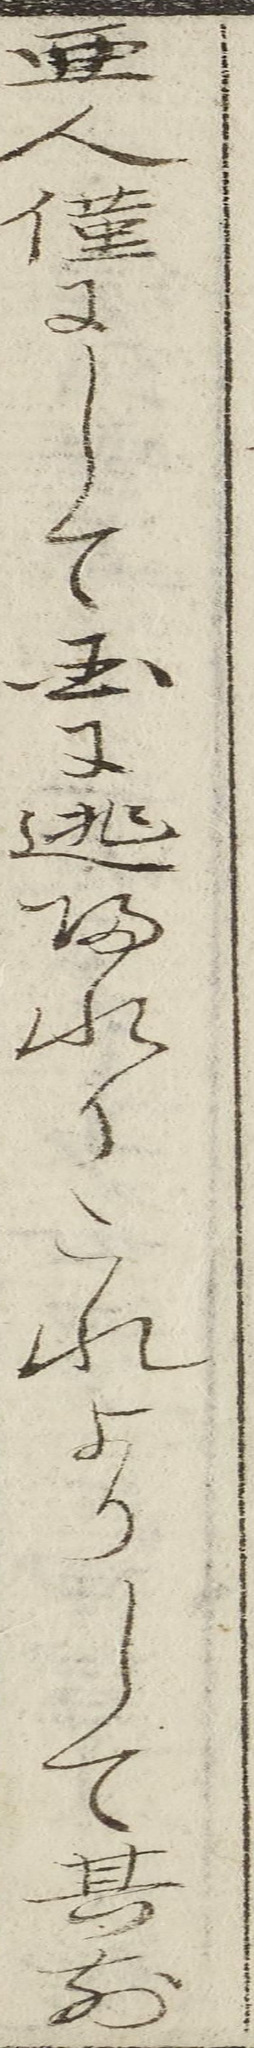亜人僅にして国に逃帰れりこれよりして其前
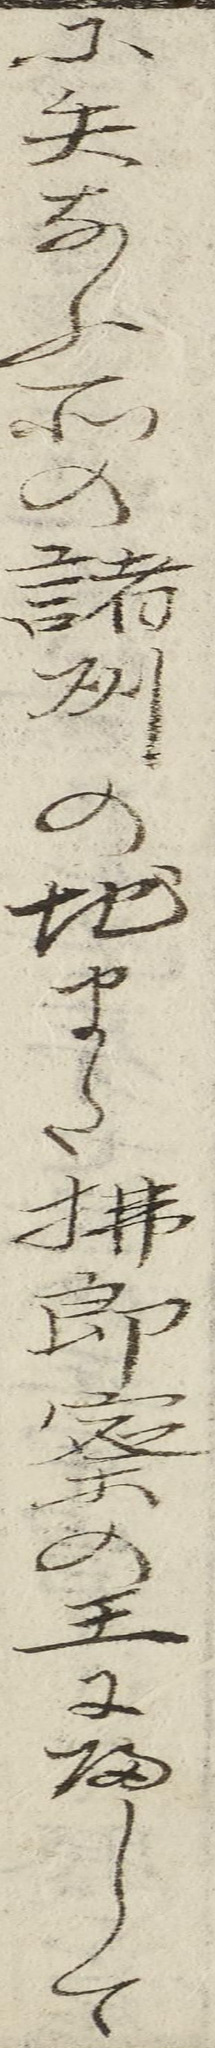に失なふ所の諸州の地また拂郎察の王に帰して
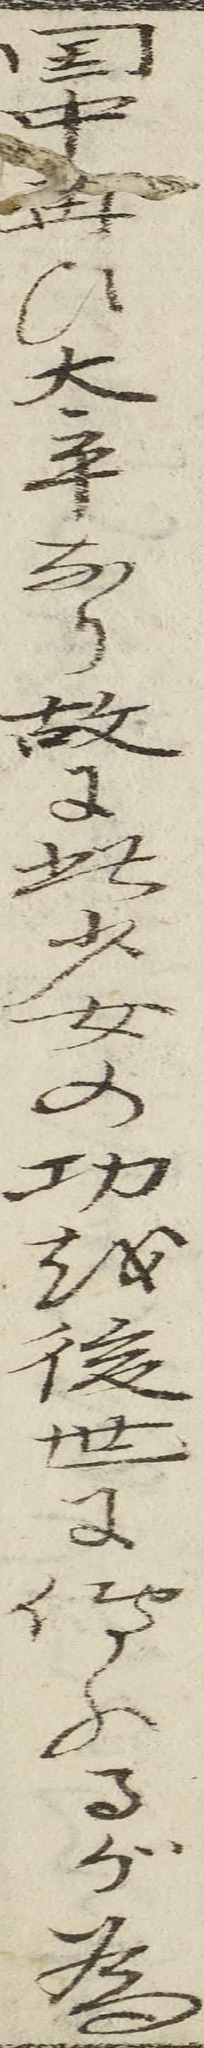国中再ひ大平なり故に此少女の功を後世に伝ふるが為

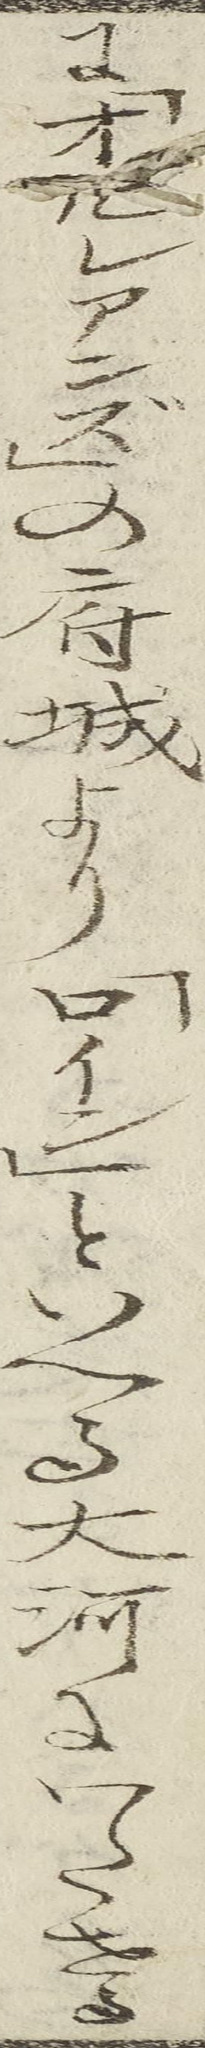に「オルレアンズ」の府城より「ロイン」といへる大河にわたせる
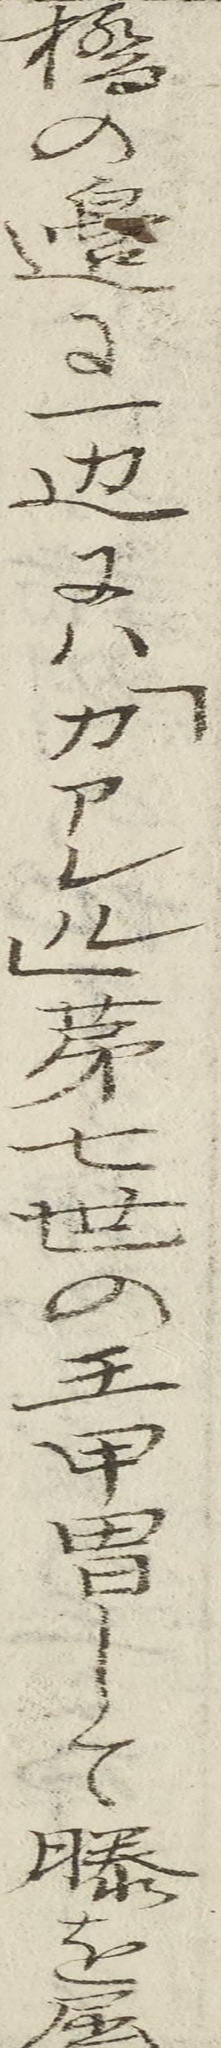橋の辺に一辺にハ「カアレル」第七世の王甲冑して勝を届
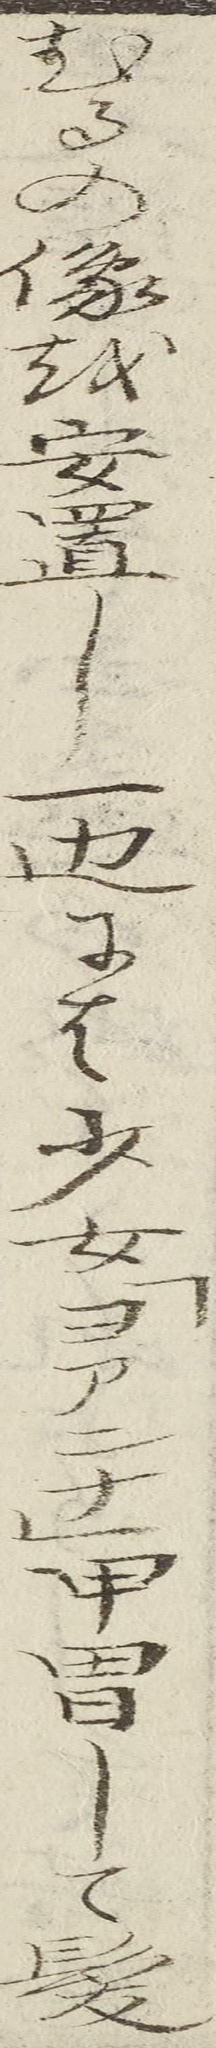むるの像を安置し一辺には少女「ヨアンナ」甲冑して髪
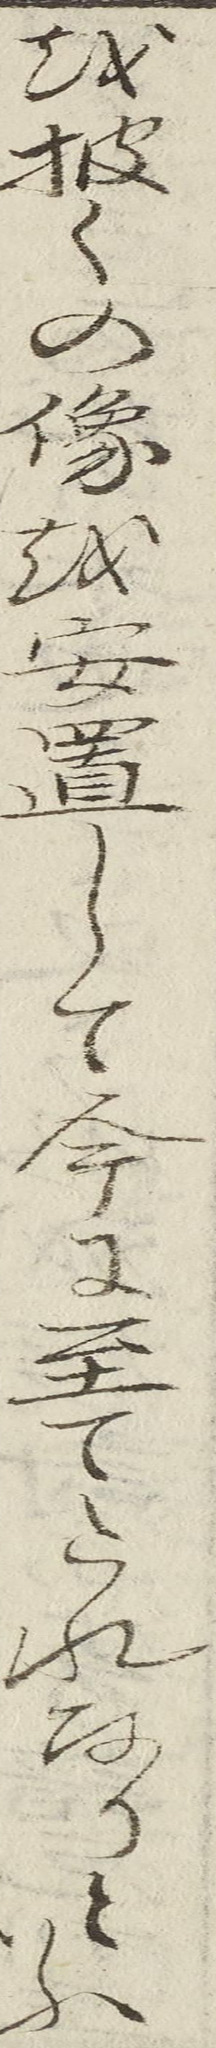を披くの像を安置して今に至てこれなりといふ
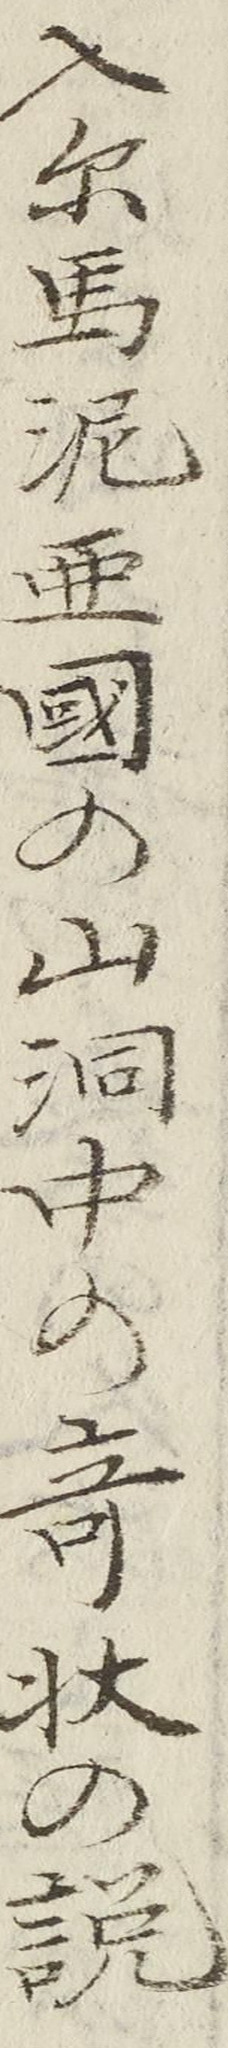入尓馬泥亜国の山洞中の奇状の説
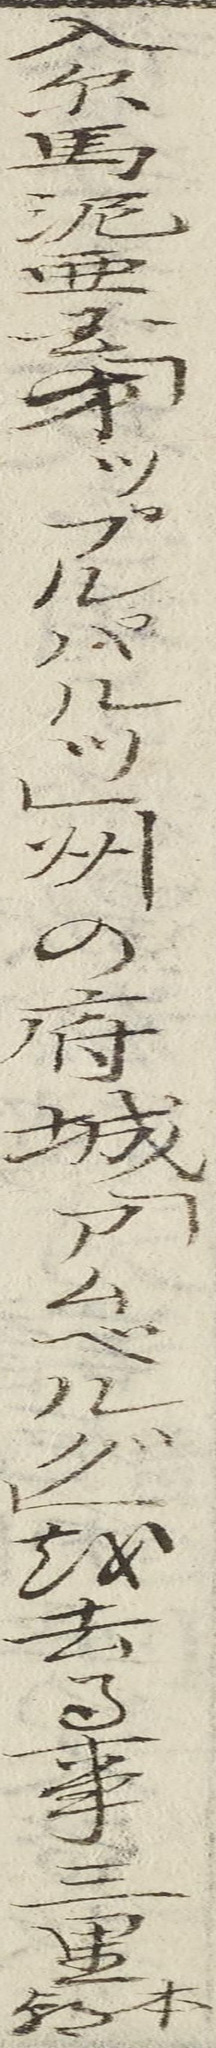入尓馬泥亜国「オップルパルツ」州の府城「アムベルグ」を去る事三里本朝
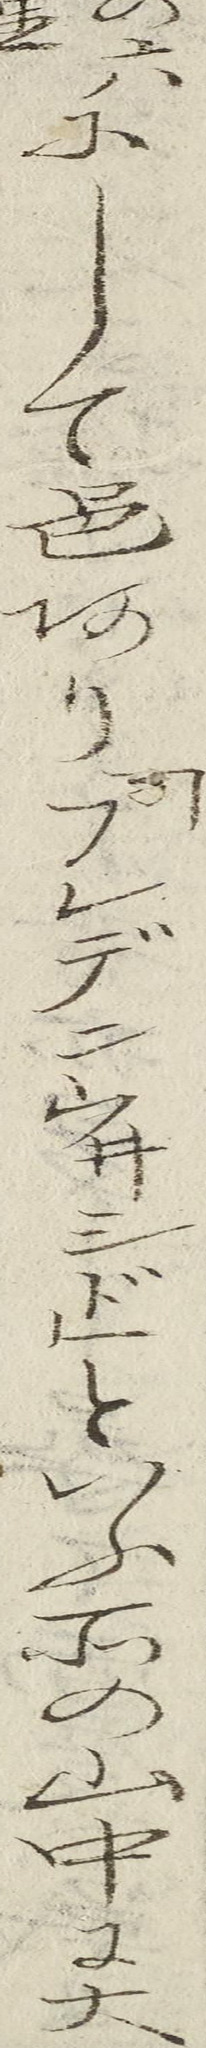の六里にして邑あり「プレデ二ウ井シド」といふ所の山中に大
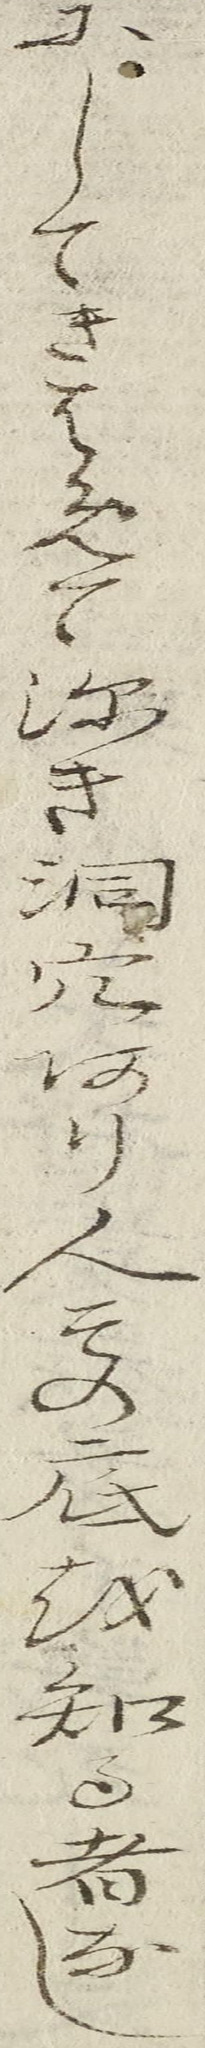にしてきはめて深き洞穴あり人その底を知る者なし
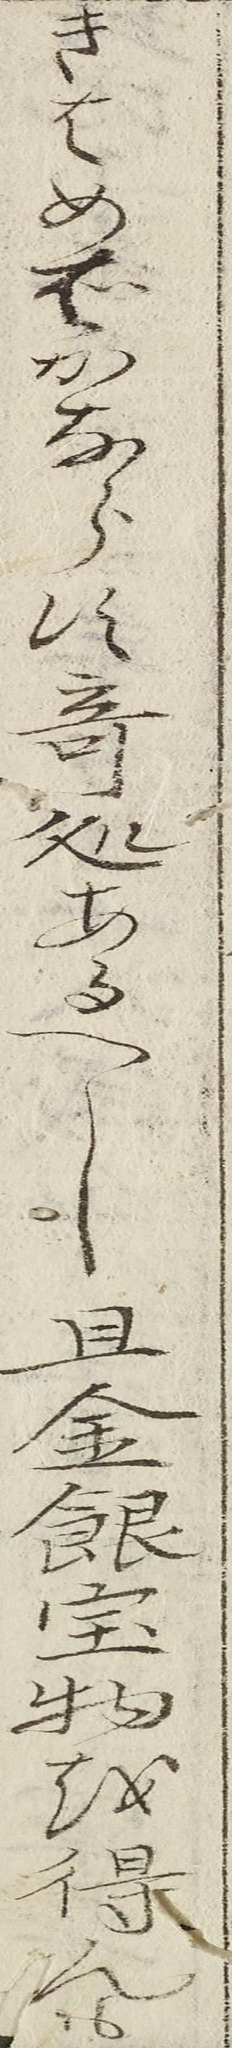きはめばかならす奇処あるへし且金銀宝物を得んも
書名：西洋雜記　乾
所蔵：東京大学地震研究所図書室 Earthquake Research Institute Library, The University of Tokyo, JAPAN
